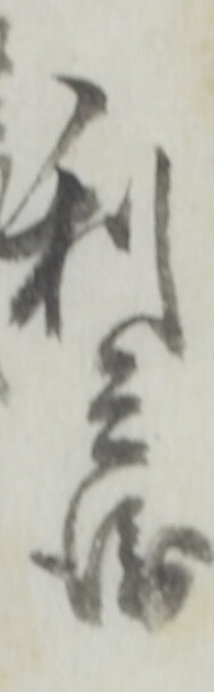茂兵衛
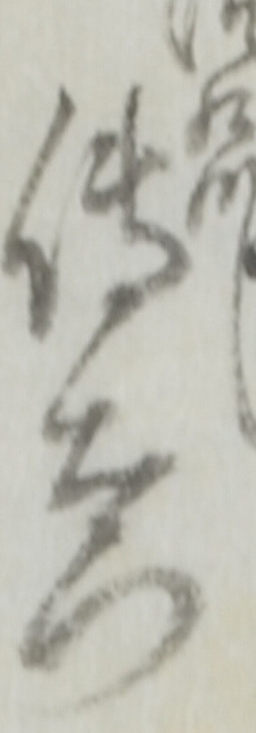久右衛門
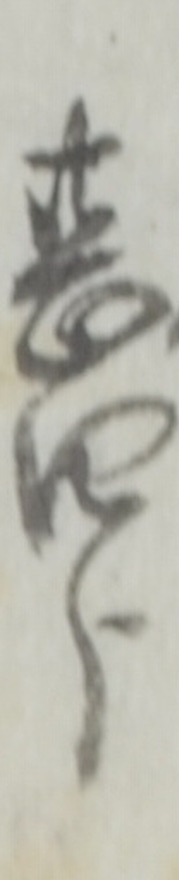甚四郎
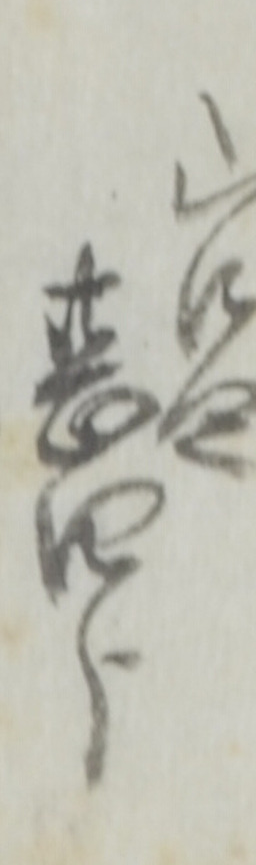甚四郎
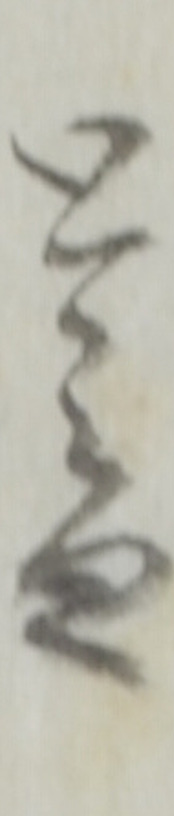とミや
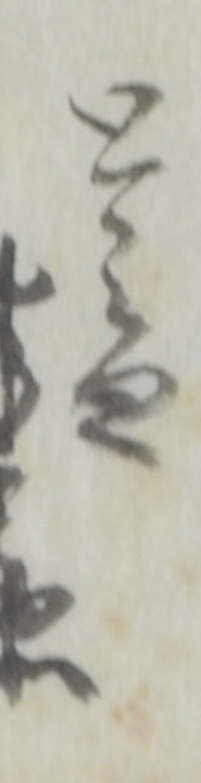とミや
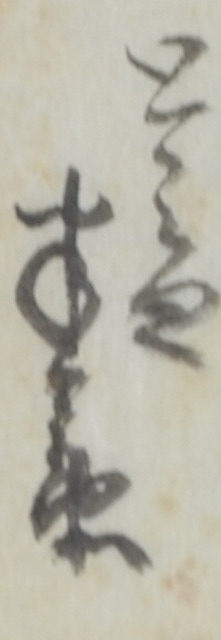半兵衛
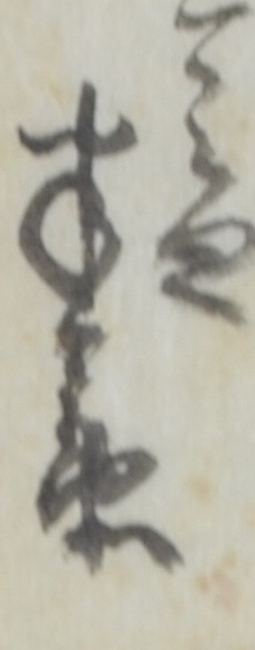半兵衛
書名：勧化人割帳
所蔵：伊那市立高遠町図書館・合同会社AMANE
